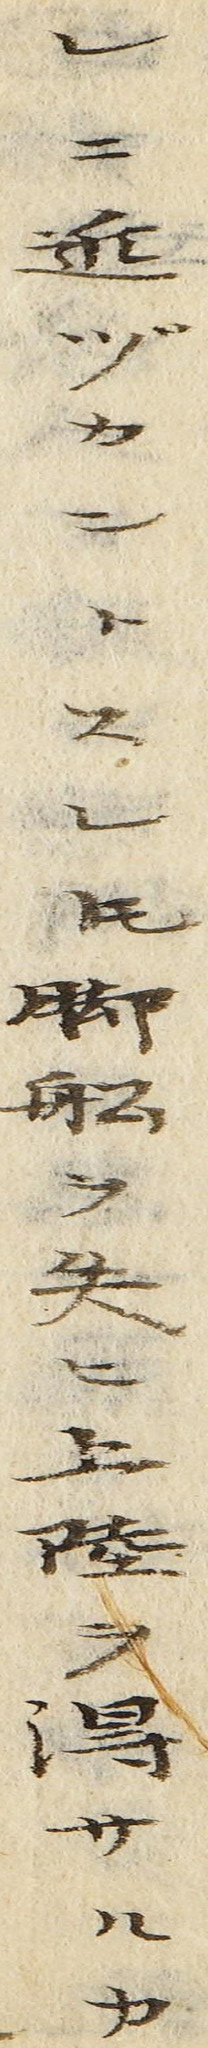レニ近ヅカントスレトモ脚船ヲ失ヒ上陸ヲ得サルカ
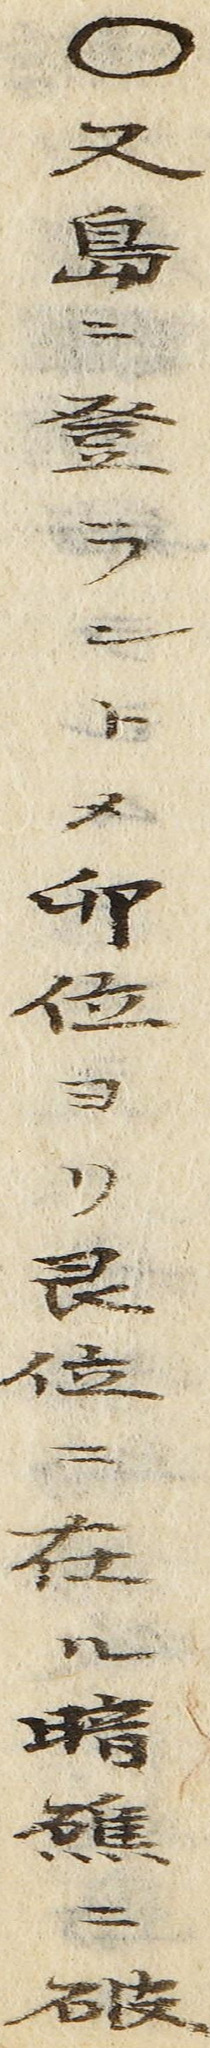◯又島ニ登ラントシテ卯位ヨリ艮位ニ在ル暗礁ニ破
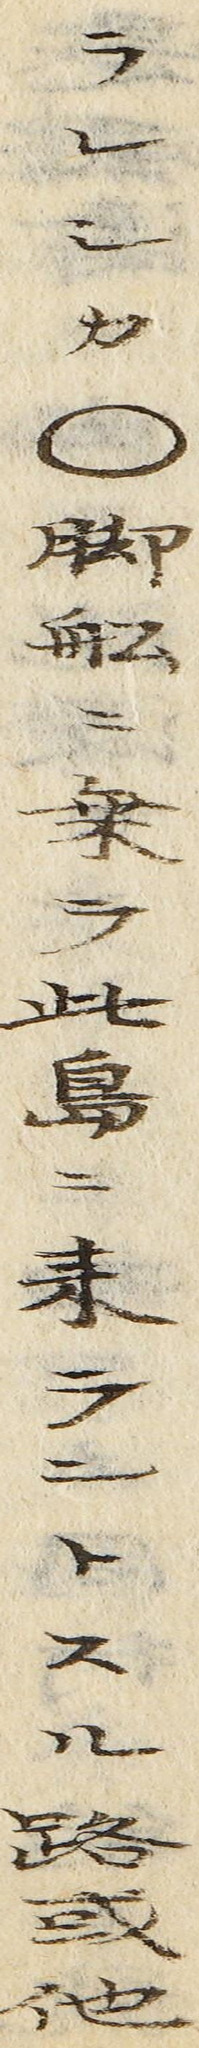ラレシカ◯脚船ニ乗テ此島ニ来ラントスル路或他
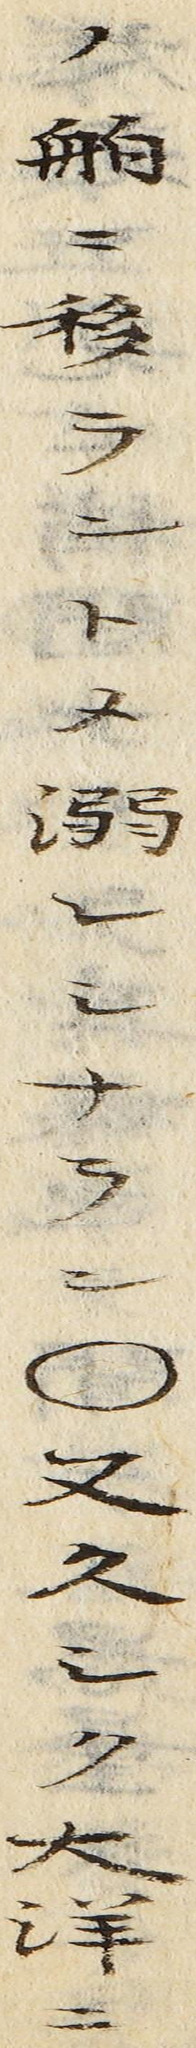ノ舶ニ移ラントシテ溺レシナラン◯又久シク大洋ニ
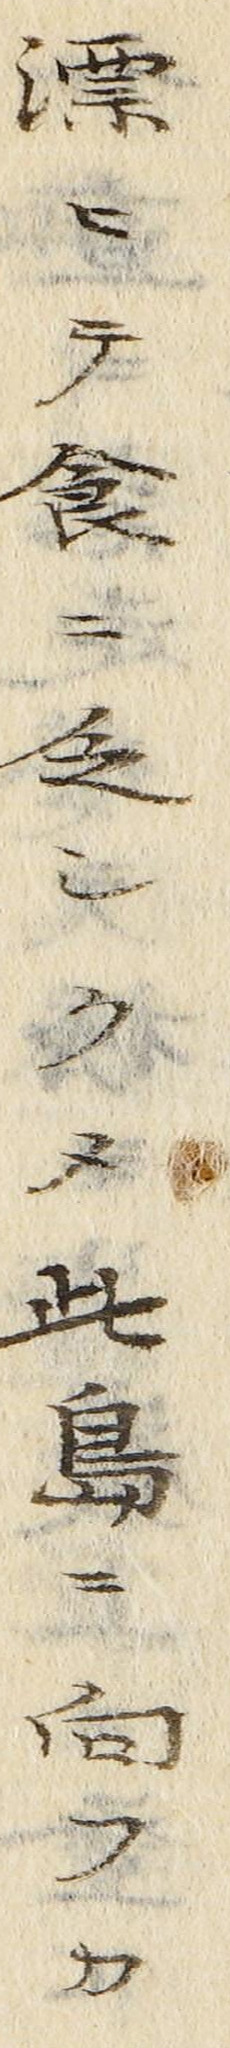漂ヒテ食ニ乏シクシテ此島ニ向フカ
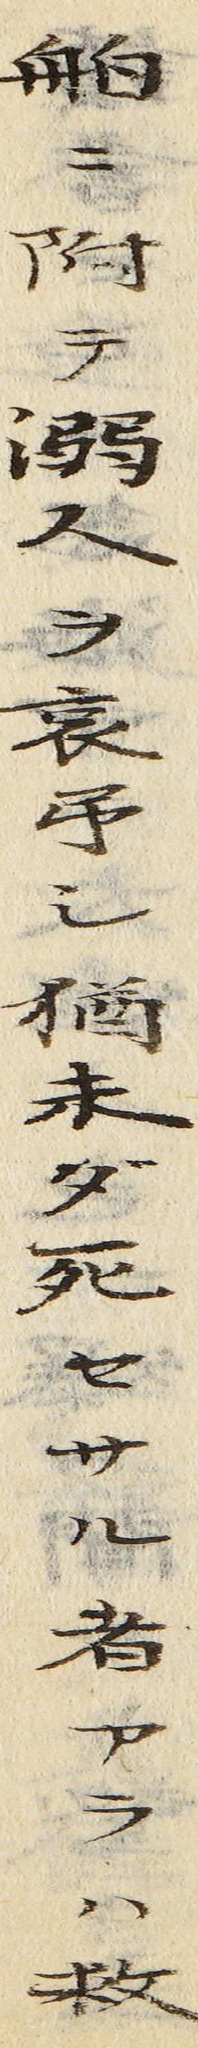舶ニ附テ溺人ヲ哀弔シ猶未ダ死セサル者アラハ救
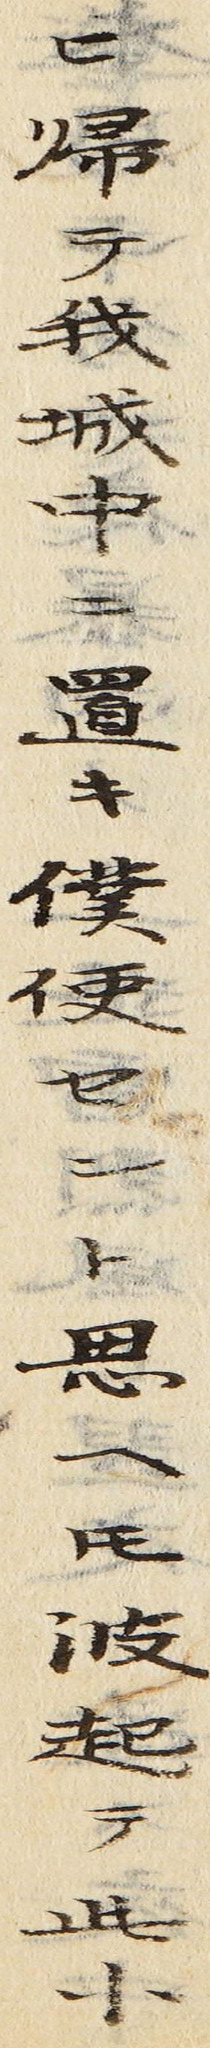ヒ帰テ我城中ニ置キ僕使セント思ヘトモ波起テ此小
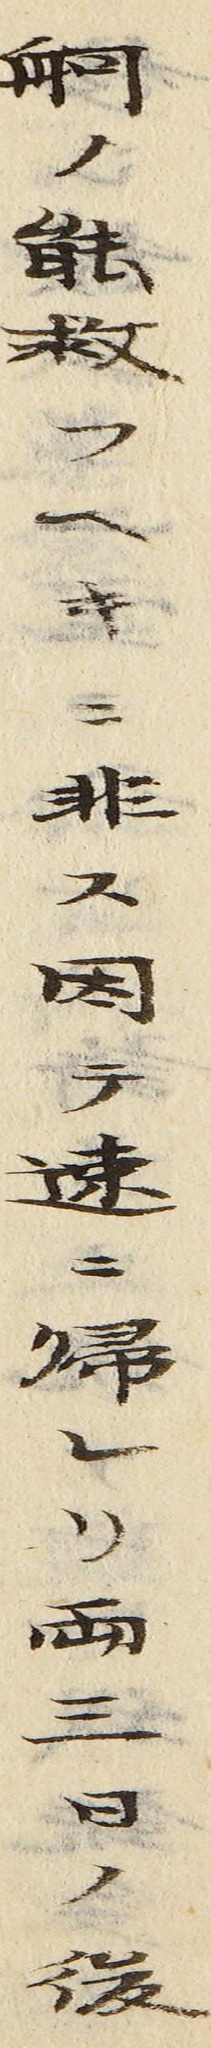舸ノ能救フヘキニ非ス因テ速ニ帰レリ両三日ノ後
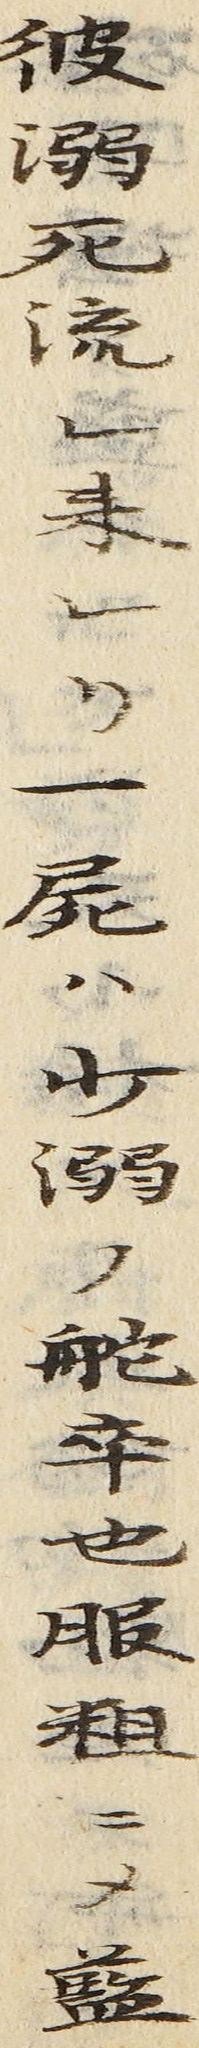彼溺死流レ来レリ一屍ハ少溺ノ舵卒也服粗ニシテ藍
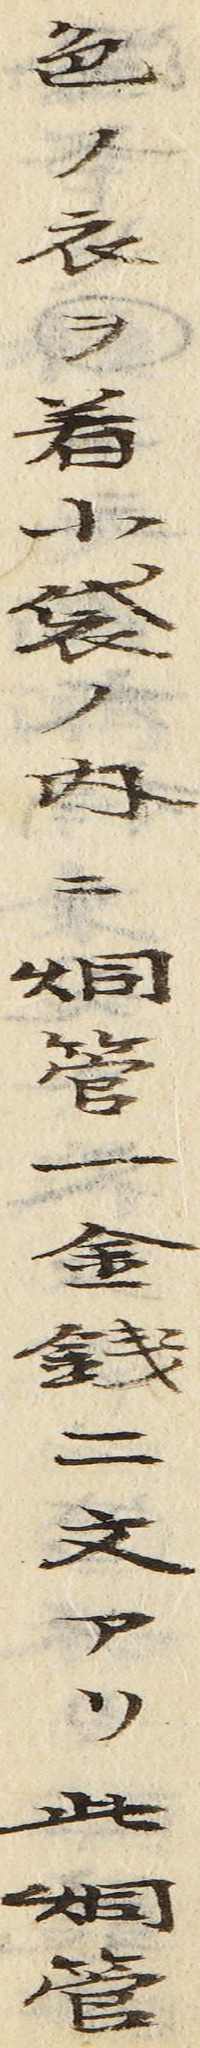色ノ衣ヲ着小袋ノ内ニ煙管一金銭二文アリ此煙管
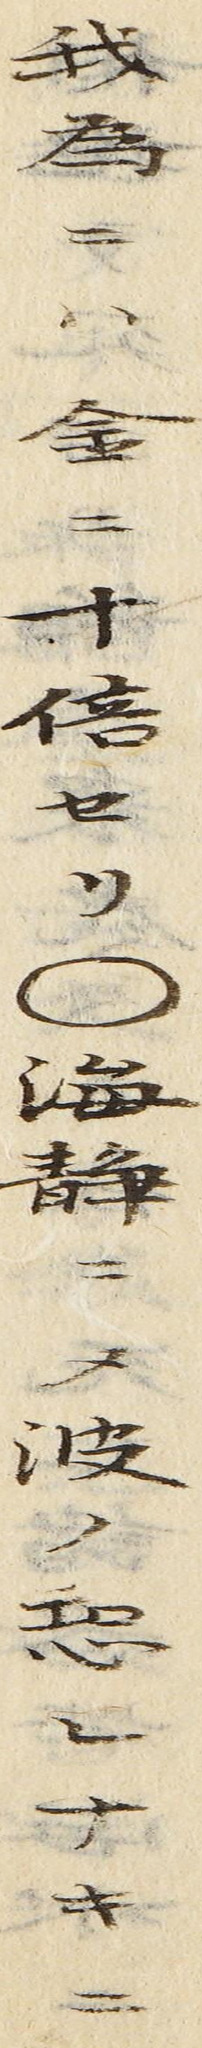我為ニハ金ニ十倍セリ◯海静ニシテ波ノ恐レナキニ
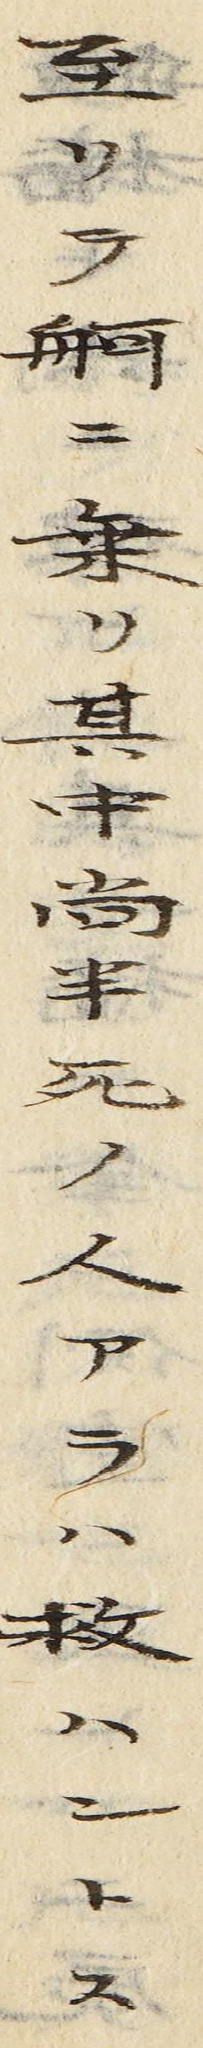至リテ舸ニ乗リ其中尚半死ノ人アラハ救ハントス
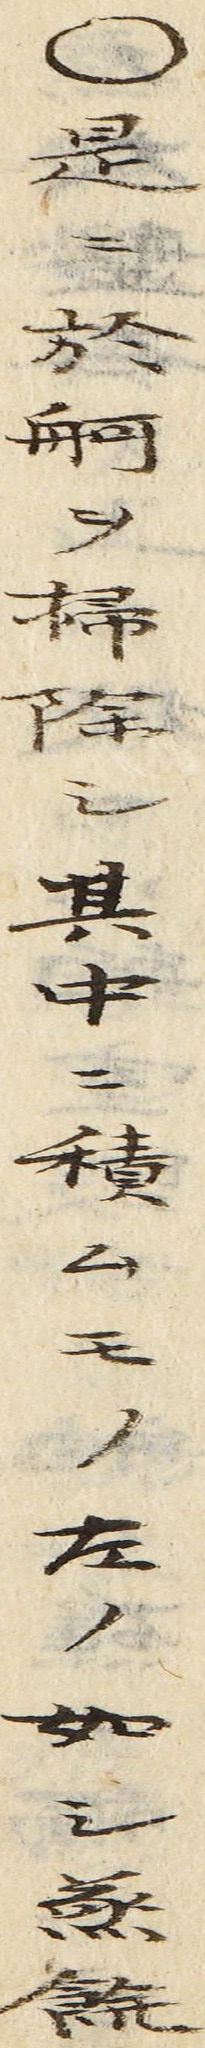◯是ニ於舸ヲ掃除シ其中ニ積ムモノ左ノ如シ蒸餅
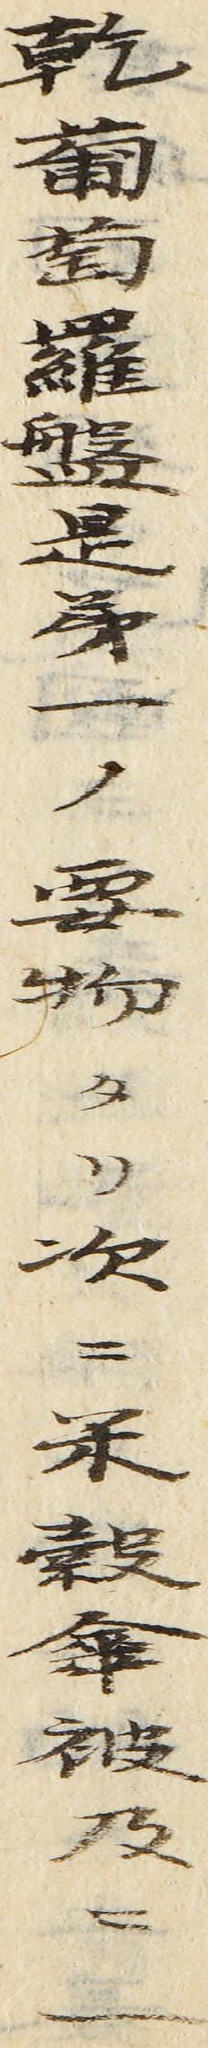乾葡萄羅盤是第一ノ要物タリ次ニ米穀傘被及ヒ一
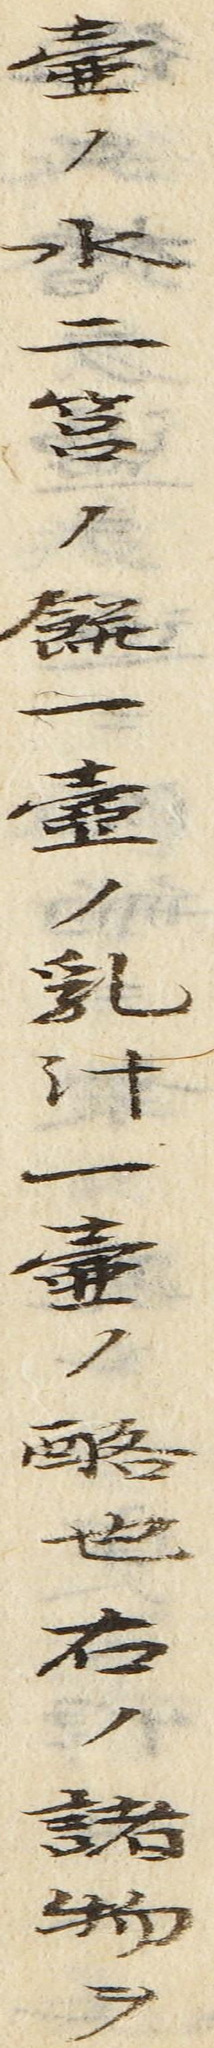壺ノ水二筥ノ餅一壺ノ乳汁一壺ノ酪也右ノ諸物ヲ
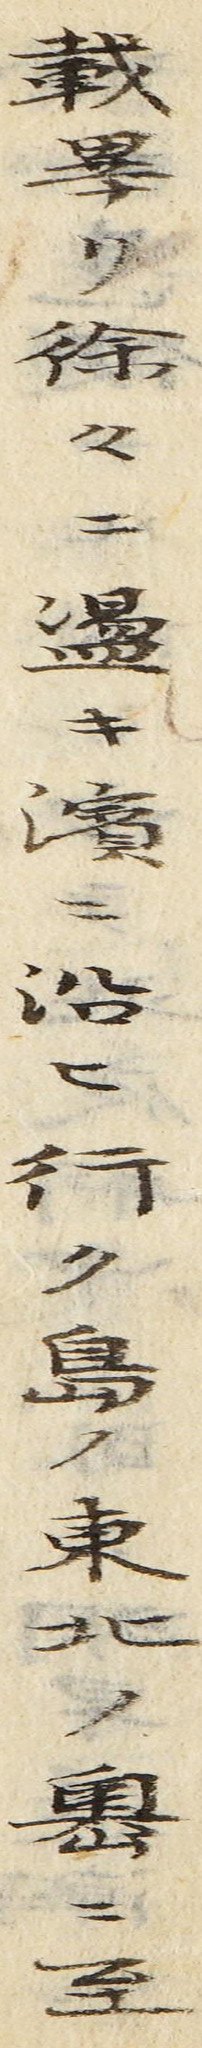載畢リ徐々ニ盪キ浜ニ沿ヒ行ク島ノ東北ノ嶴ニ至
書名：漂流紀事
